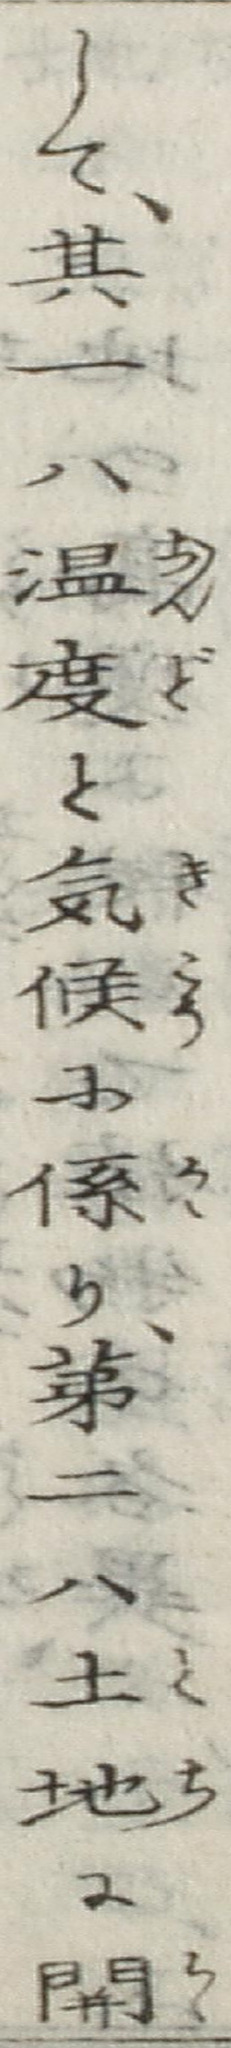して、其一は温度と気候に係り、第二は土地に関
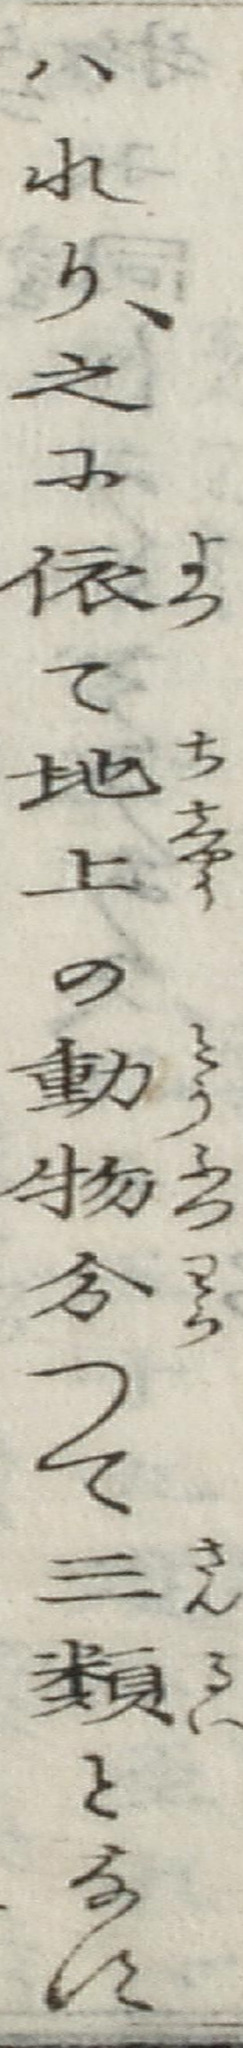はれり、之に依て地上の動物分つて三類となす
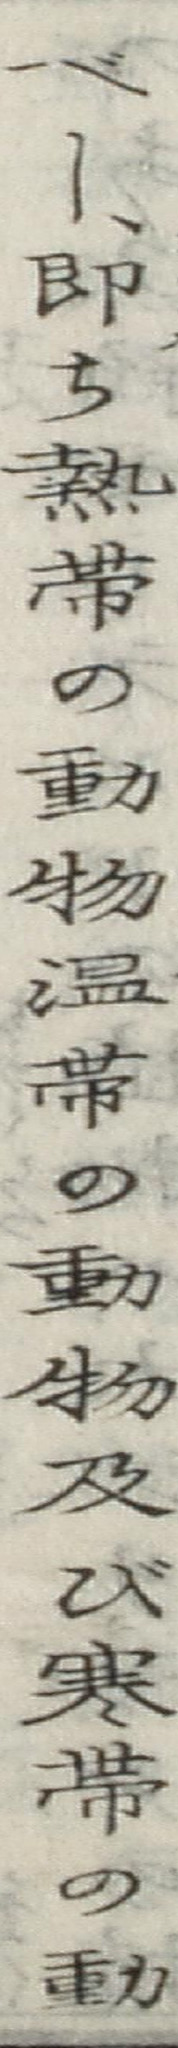べし、即ち熱帯の動物温帯の動物及び寒帯の動
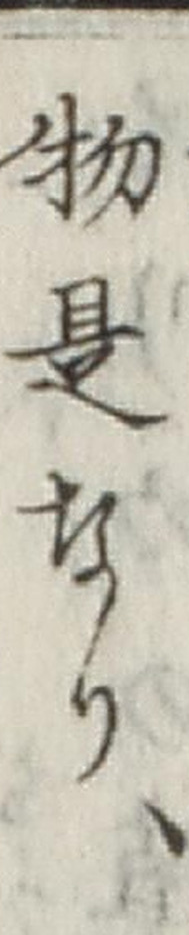物是なり、
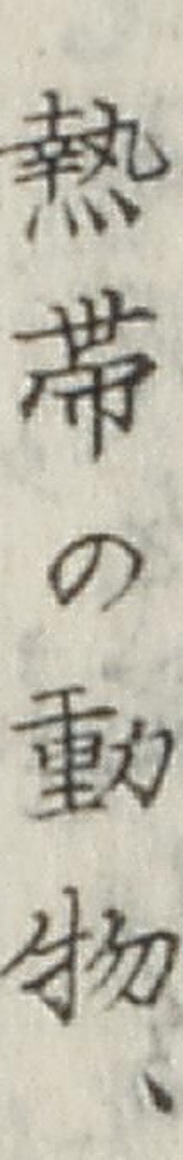熱帯の動物、
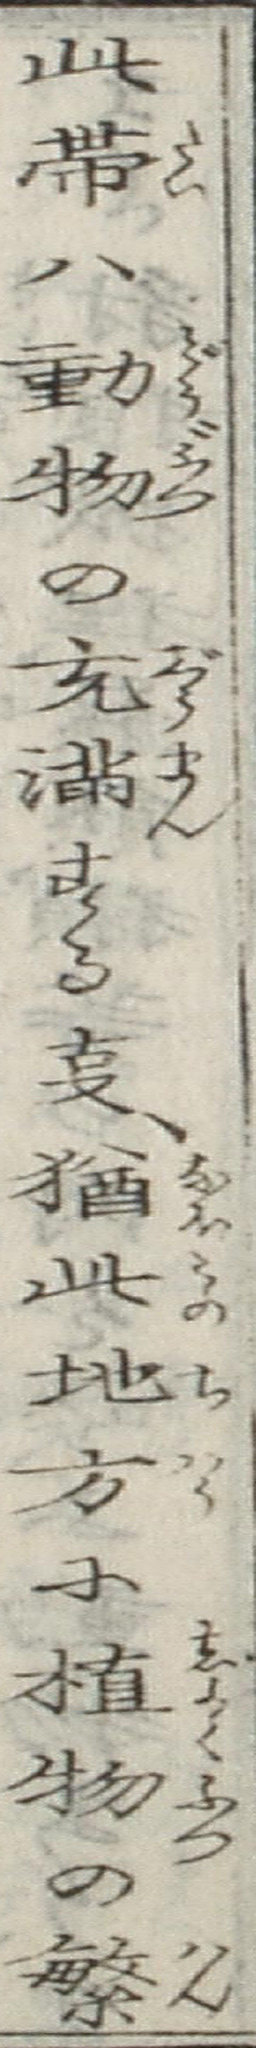此帯は動物の充満する事、猶此地方に植物の繁
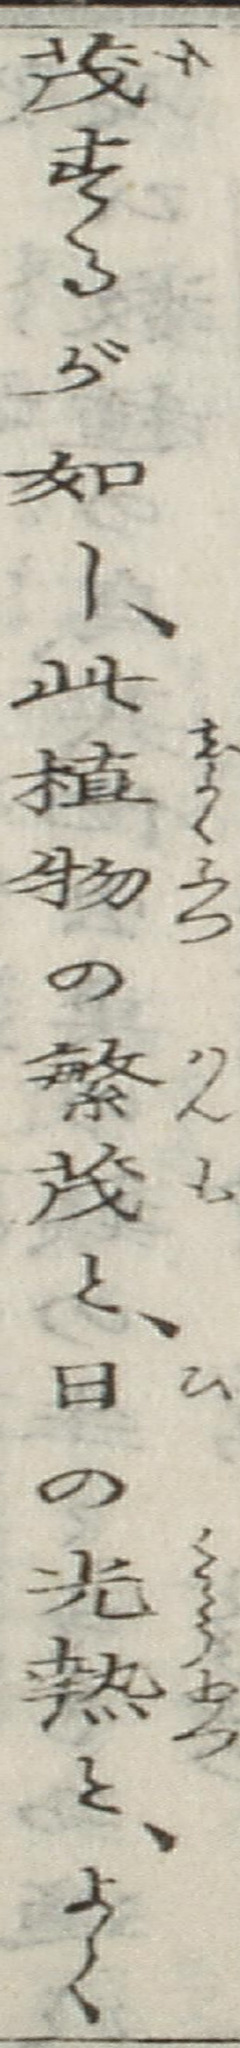茂するが如し、此植物の繁茂と、日の光熱と、よく
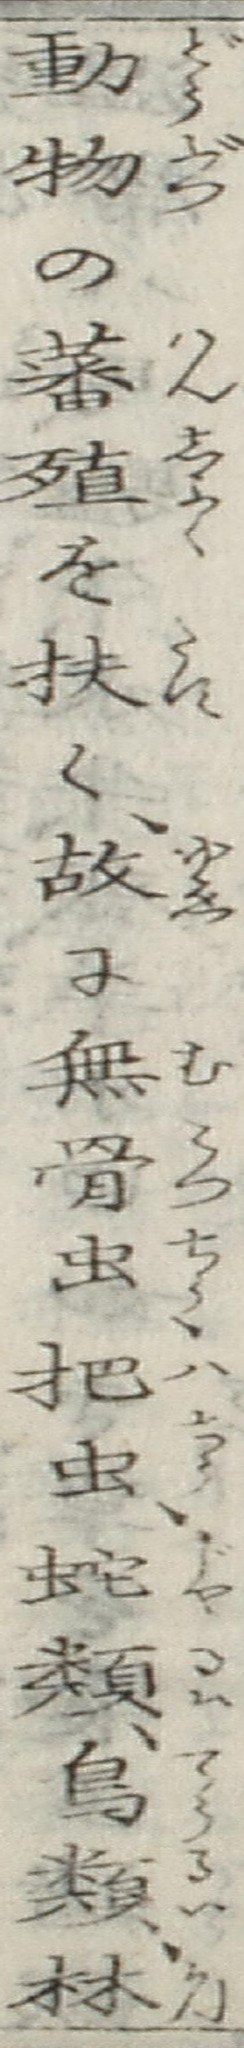動物の蕃殖を扶く、故に無骨虫、把虫、蛇類、鳥類、林
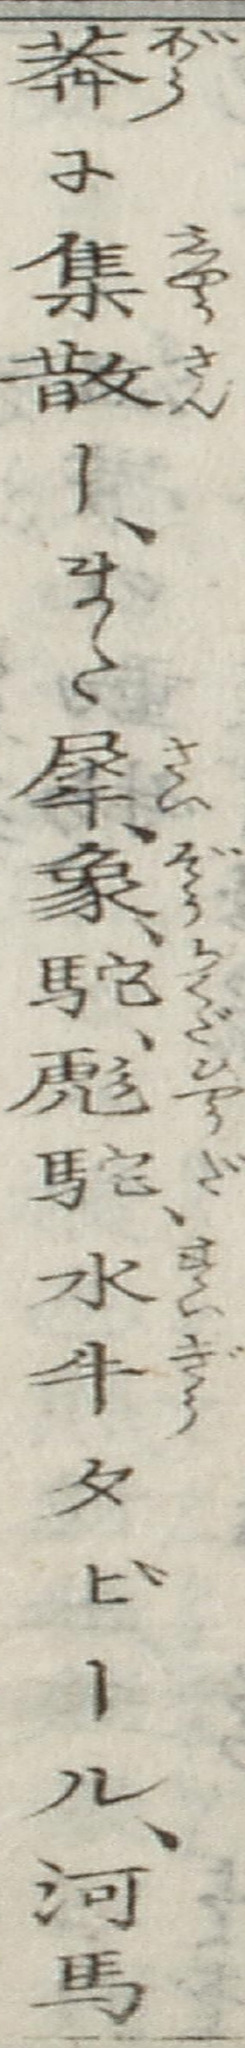莽に集散し、また犀、象、駱、彪駝、水牛タビール、河馬
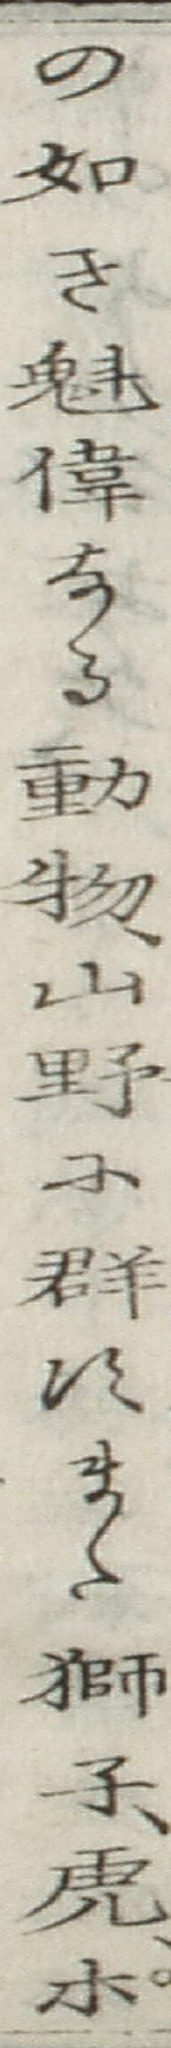の如き魁偉なる動物、山野に群す、また獅子、虎、ポ
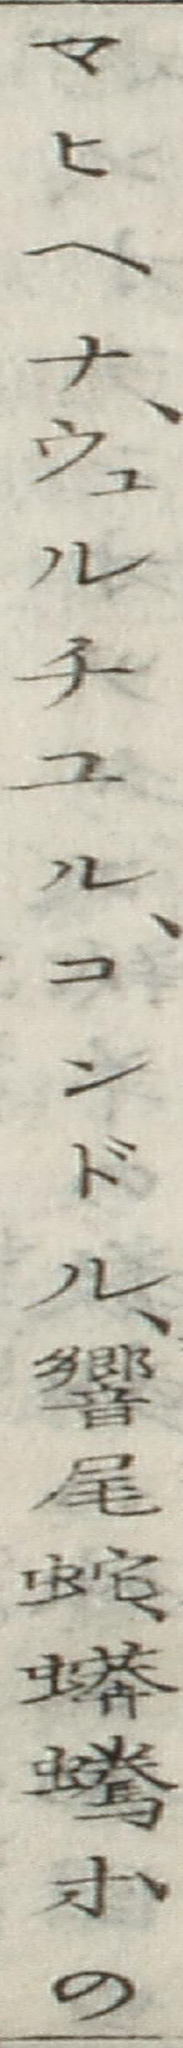マヒヘナ、ウュルチユル、コンドル、響尾蛇、蠎騰等の
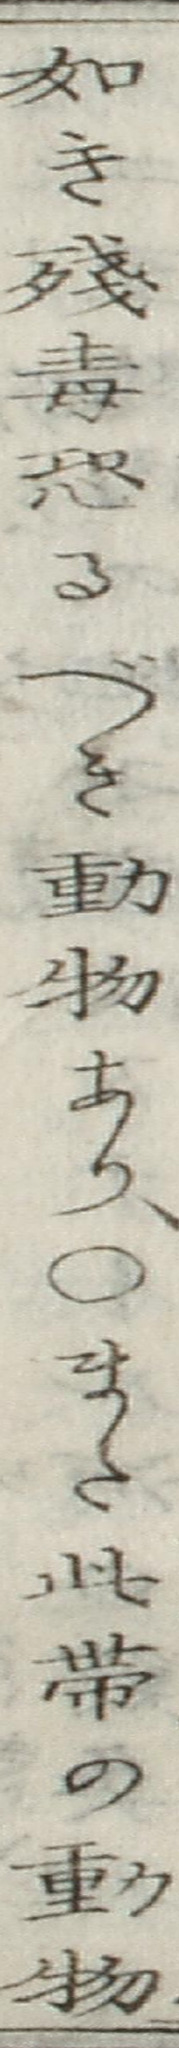如き残毒恐るべき動物あり、○また此帯の動物
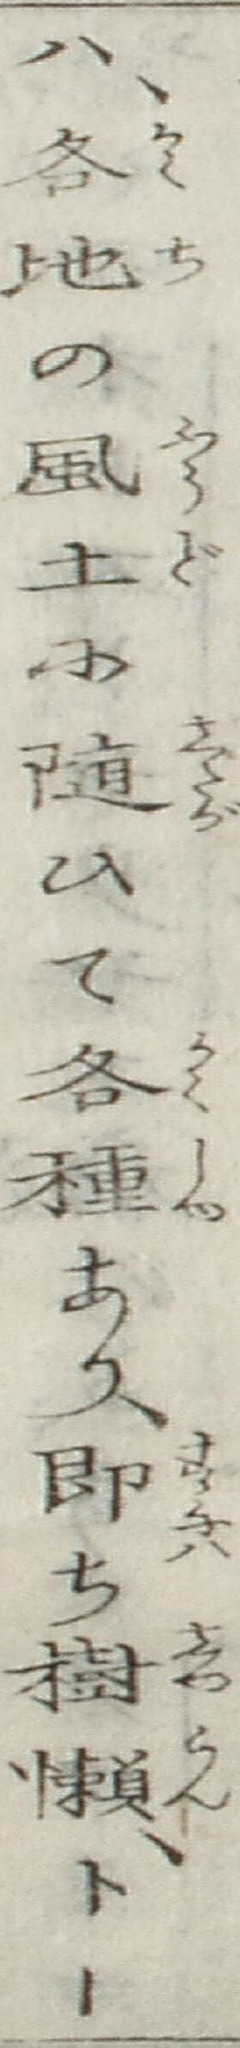は、各地の風土に随ひて各種あり、即ち樹懶、トー
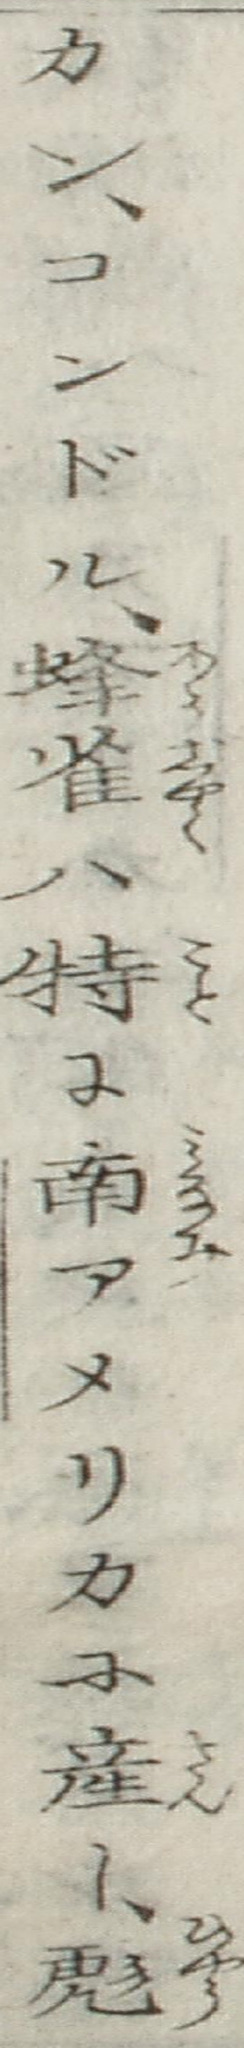カン、コンドル、蜂雀は特に南アメリカ産し、彪

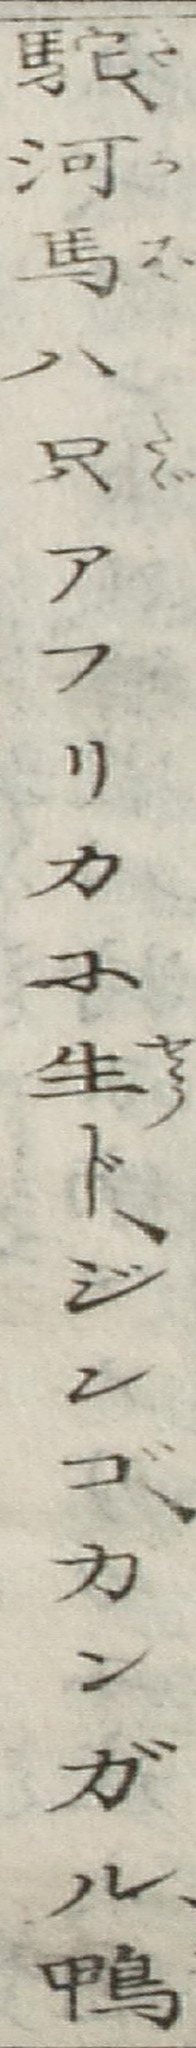駝、河馬は只アフリカに生じ、ジンゴ、カンガル、鴨
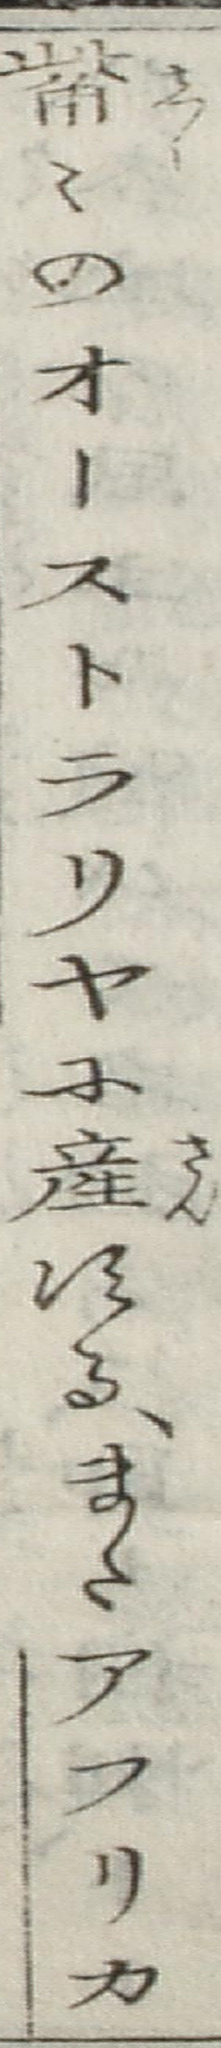觜々のオーストラリヤに産する、またアフリカ
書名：訓蒙　天然地理學　下
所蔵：東京大学地震研究所図書室 Earthquake Research Institute Library, The University of Tokyo, JAPAN
